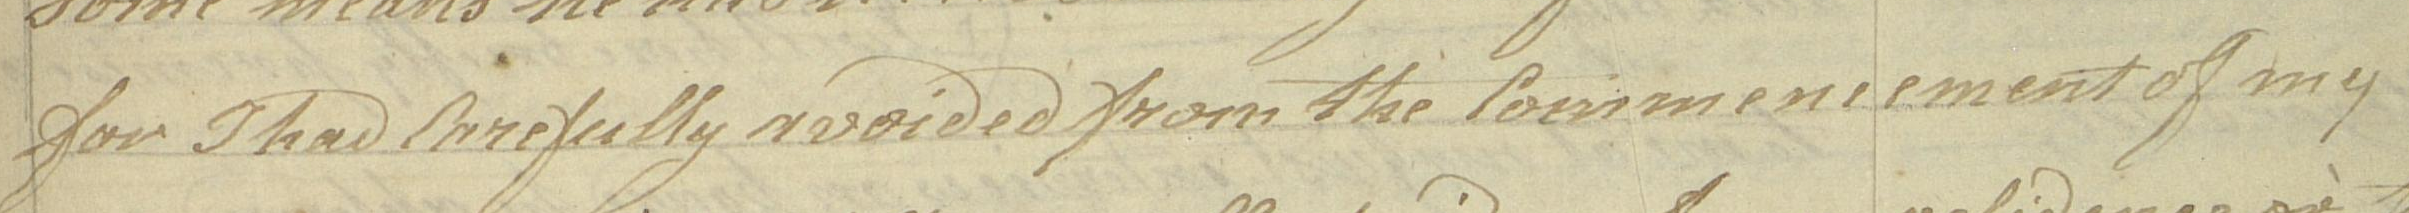for I had carefully avoided from the Commencement of my
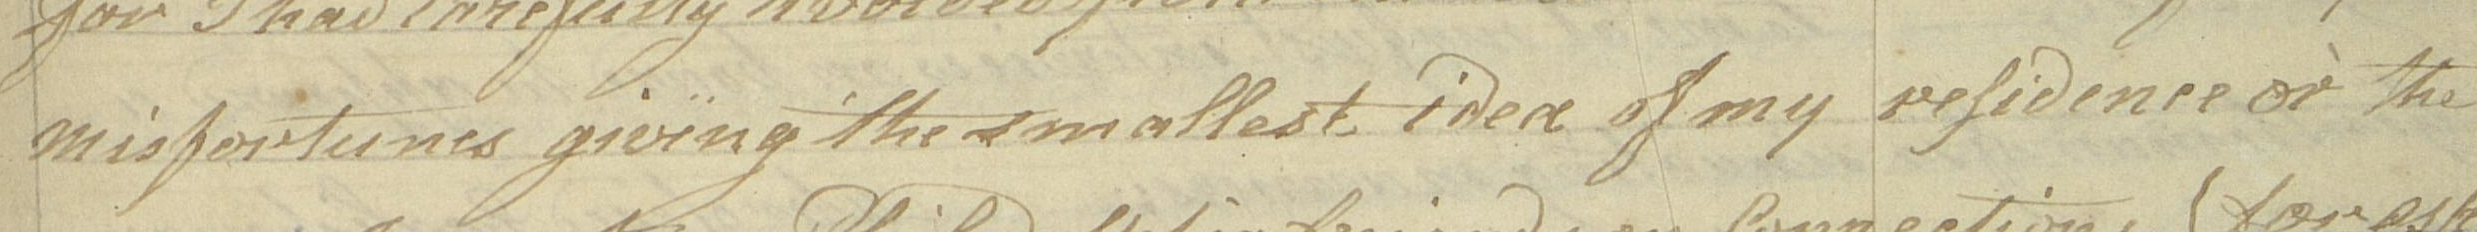misfortunes giving the smallest idea of my residence or the
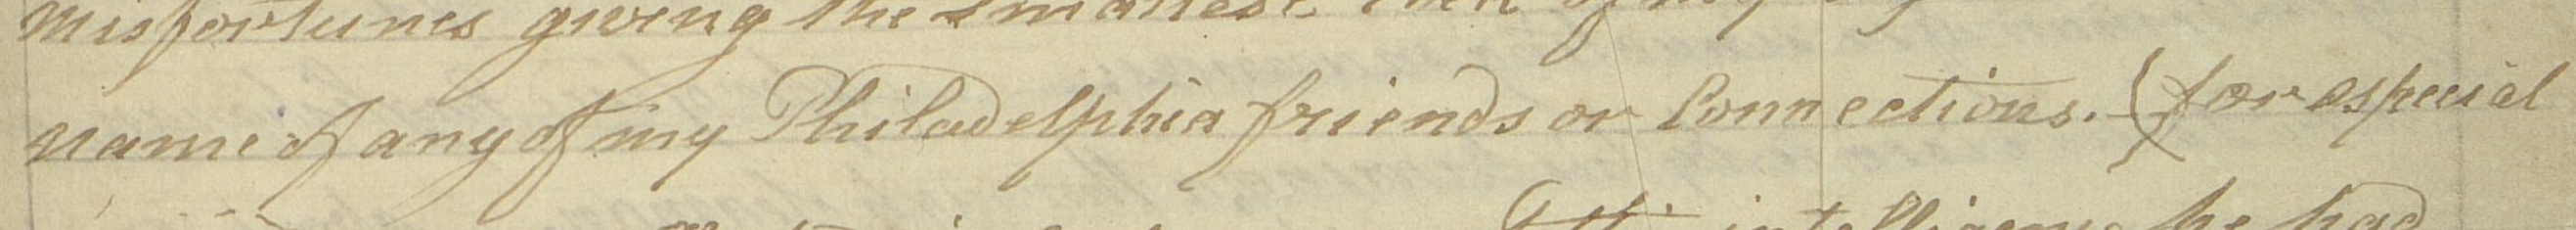name of any of my Philadelphia friends or Connections (for especial
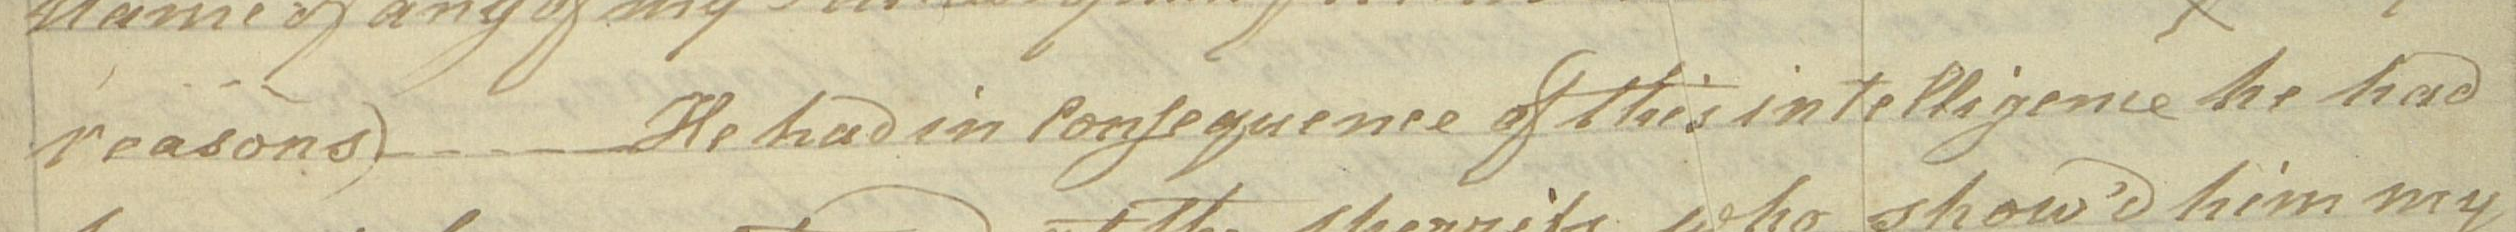reasons) He had in Consequence of this intelligence he had
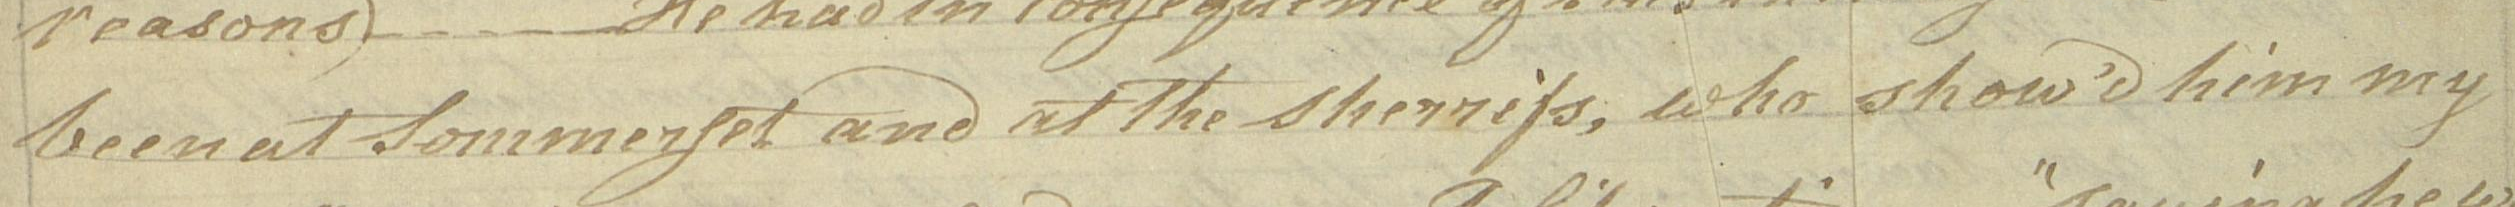been at Sommerset and at the sherrifs, who show'd him my
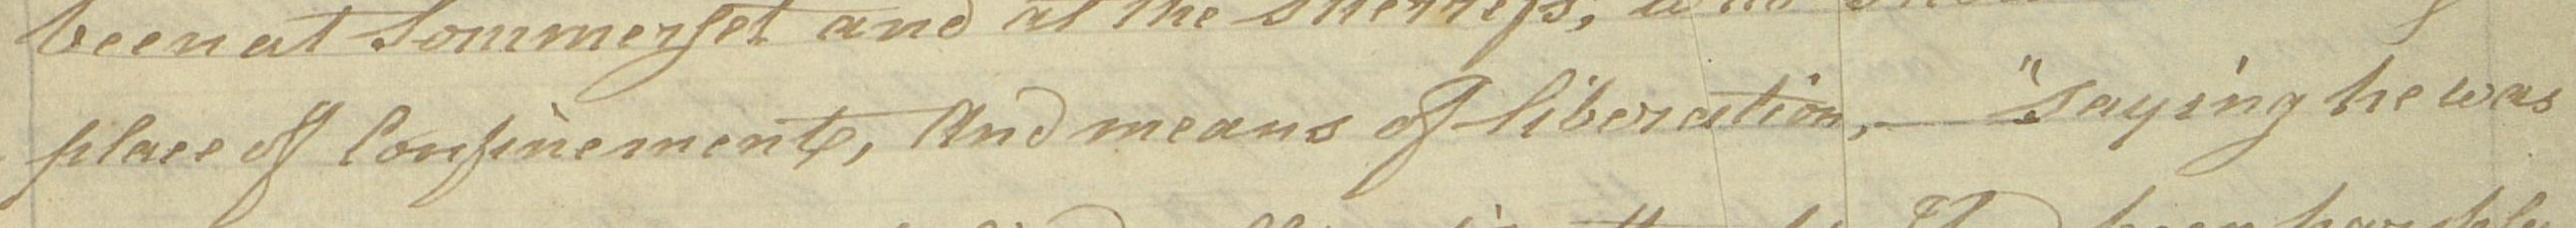place of Confinement, And means of liberation, "saying he was
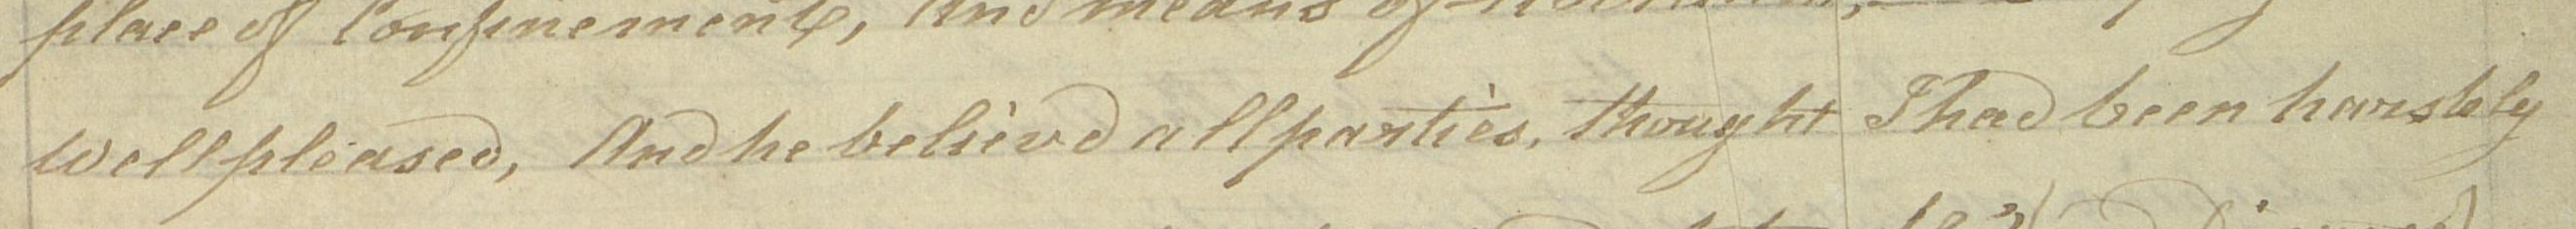Well pleased, And he believed all parties. Thought I had been harshly
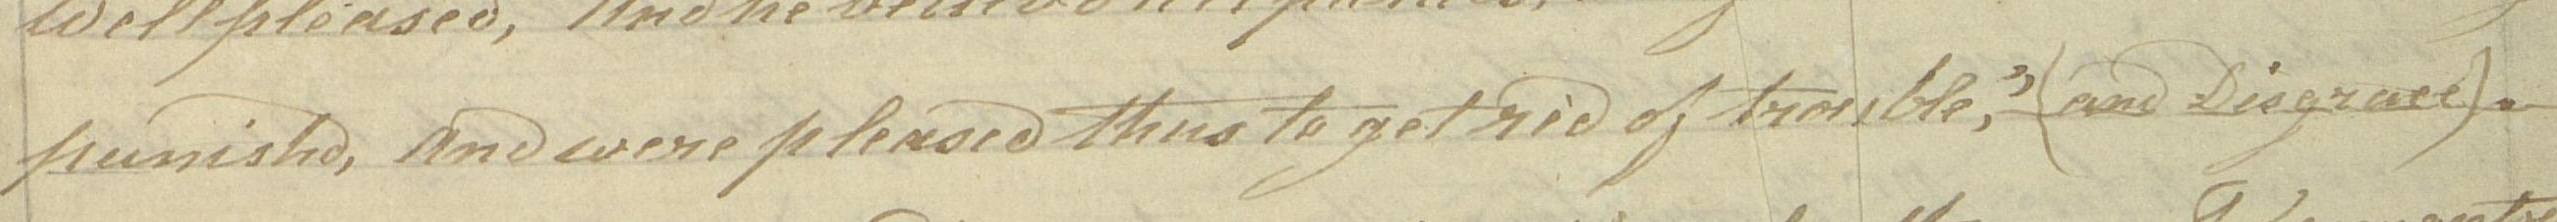punish'd And were pleased thus to get rid of trouble," (and Disgrace).
